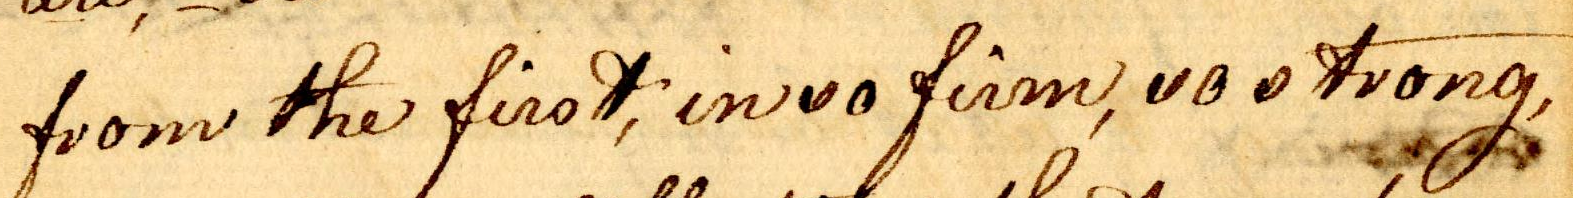from the first, in so firm, so strong
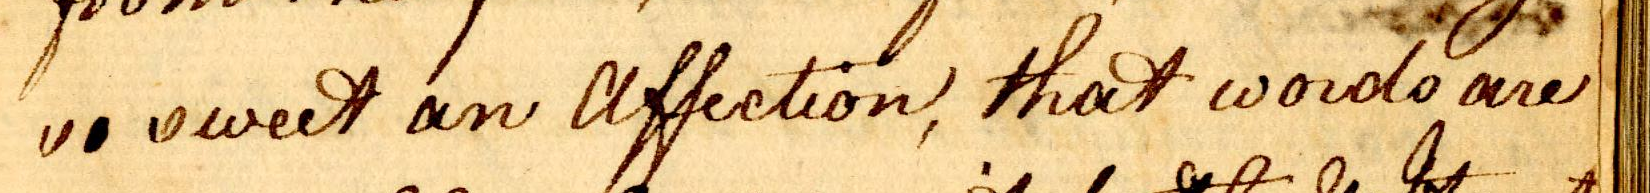so sweet an Affection, that words are
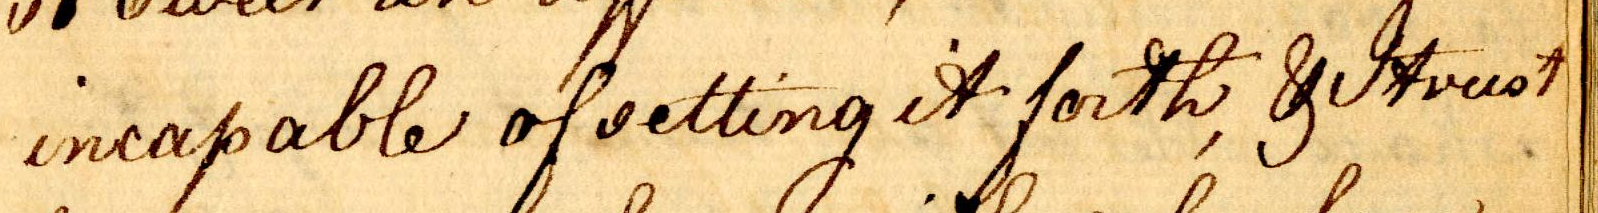incapable of setting it forth, & I trust
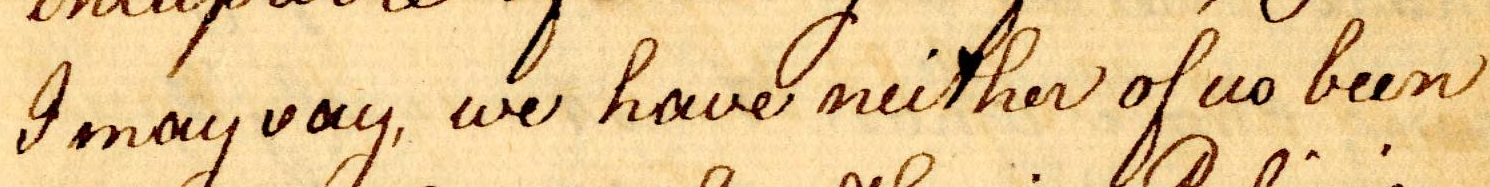I may say, we have neither of us been
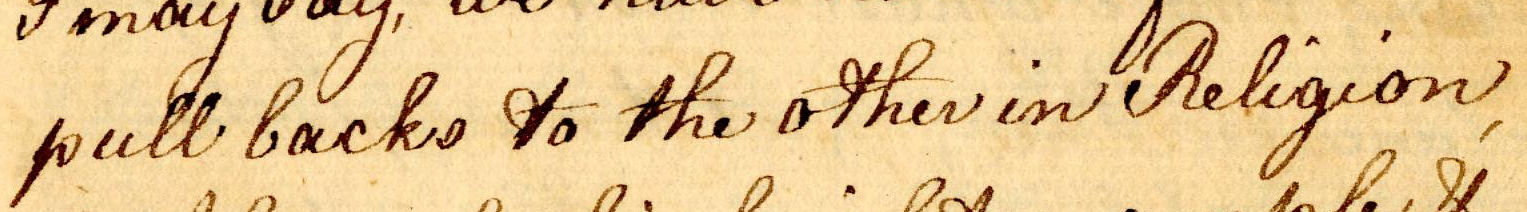pull backs to the other in Religion,
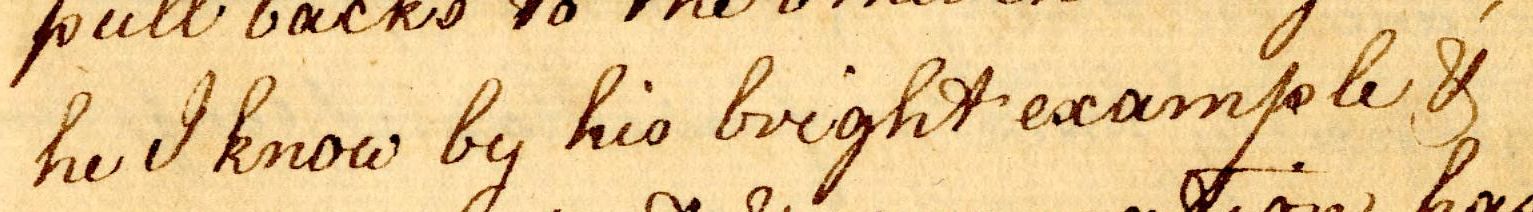he I know, by his bright example &
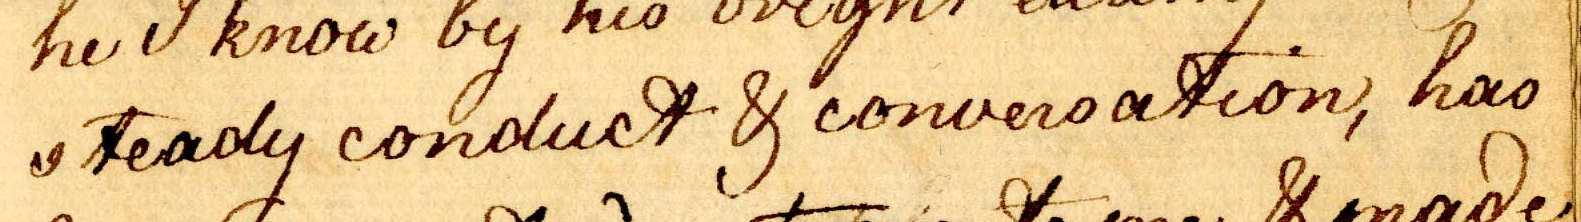steady conduct & conversation, has
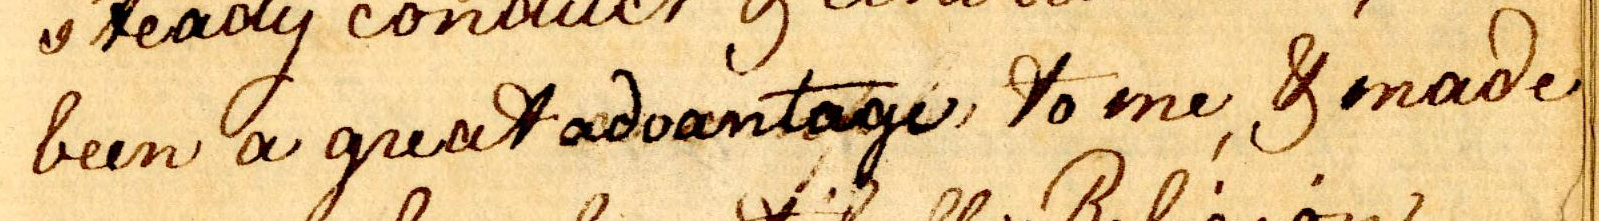been a great advantage, to me, & made
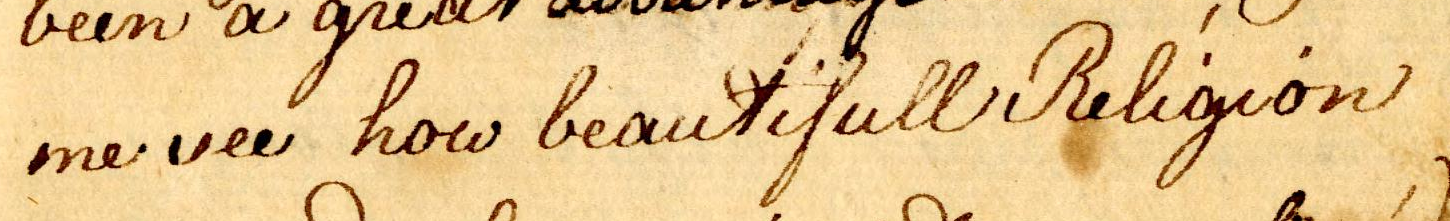me see how beautifull Religion
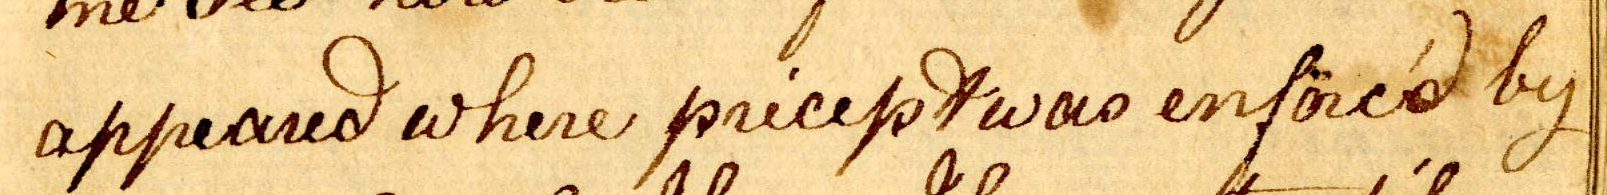appeared where pricept was enforc'd by
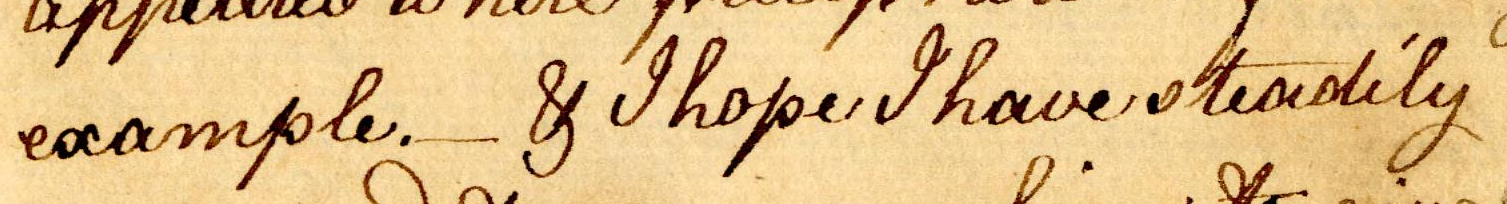example.- & I hope I have steadily
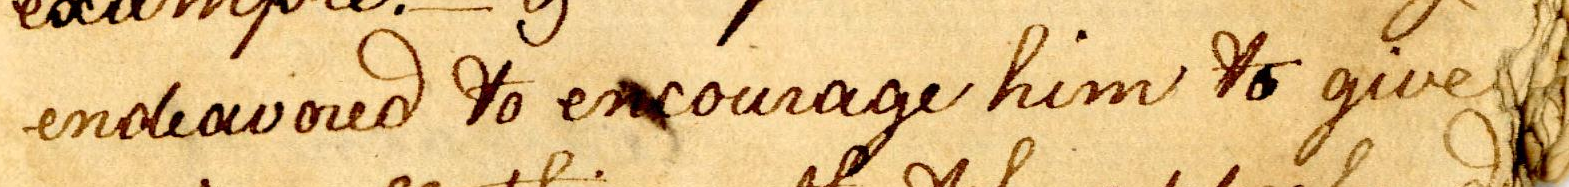endeavored to encourage him to give
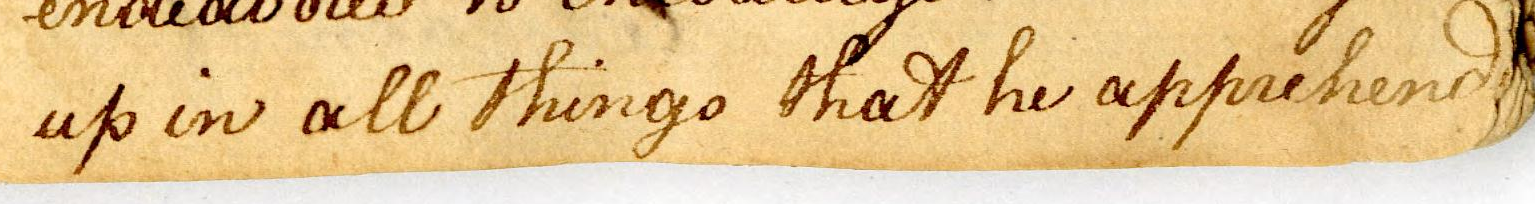up in all things that he apprehend
